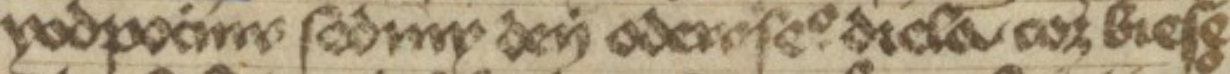yodpoċínv ſedmy deṅ odewẛe°. diela coż bieẛe
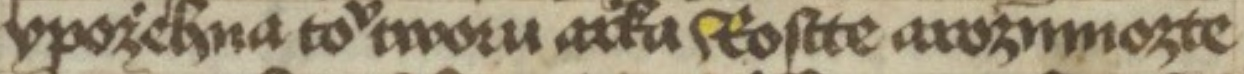ypożehna tov tworu aṙka Roſtte arozmnozte
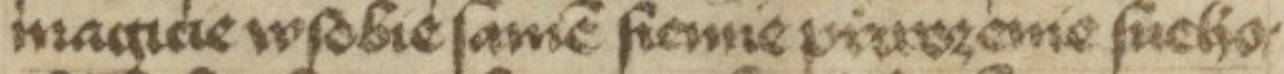magicie wſobie ſamȇ ſiemie pṙirozenie ſueho-
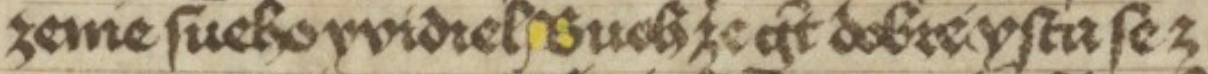zenie ſueho yvidiel Buoh że g̑t dobre yſta ſe z
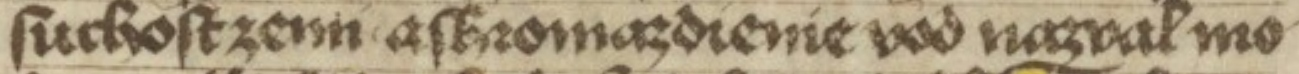ſuchoſt zemi a ſhromazdienie vod nazvaĺ mo-
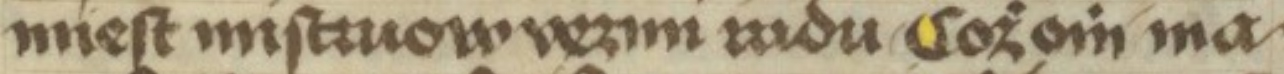mieſt miſtruow vezmi radu Což oṅi ma-
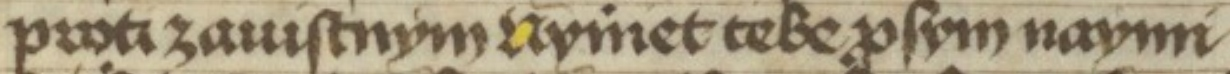proti zauiſtnym Nyṅiet tebe ꝓſym naymi-
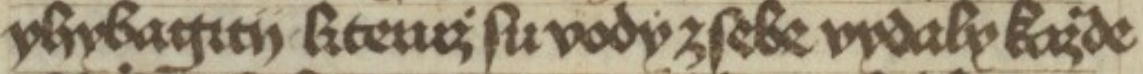yhybagitii kteruż ſu vodẏ zſebe vydaly każde
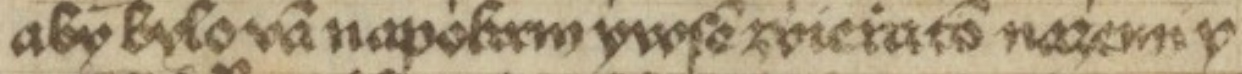aby bylo vȃ napokrm ywſȇ zvieṙatȏ nazemi y
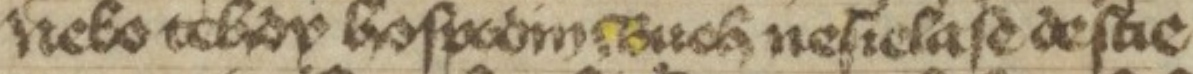Nebo tehdy hoſpodin Buoh neſielaẛe deẛtie
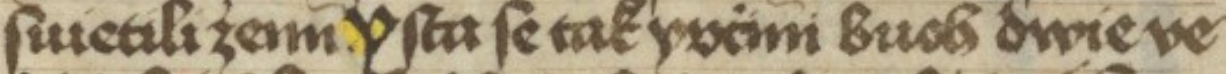ſuietili zemi. Y ſta ſe tak yvċini buoh dwie ve-
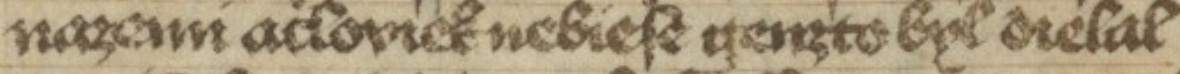nazemi aċloviek nebieẛe genżto byl dielal
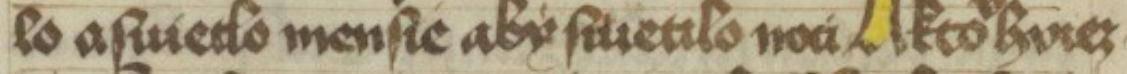lo aſuietlo menẛie aby ſuietilo noci A ktov hviez-
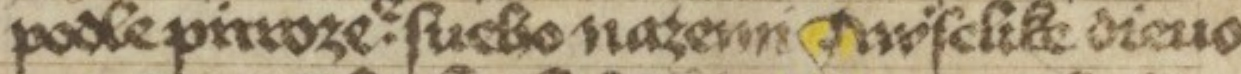podle pṙirozee. ſueho nazemi Awẛelike dieuo
